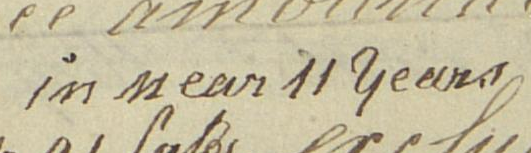in mean 11 years
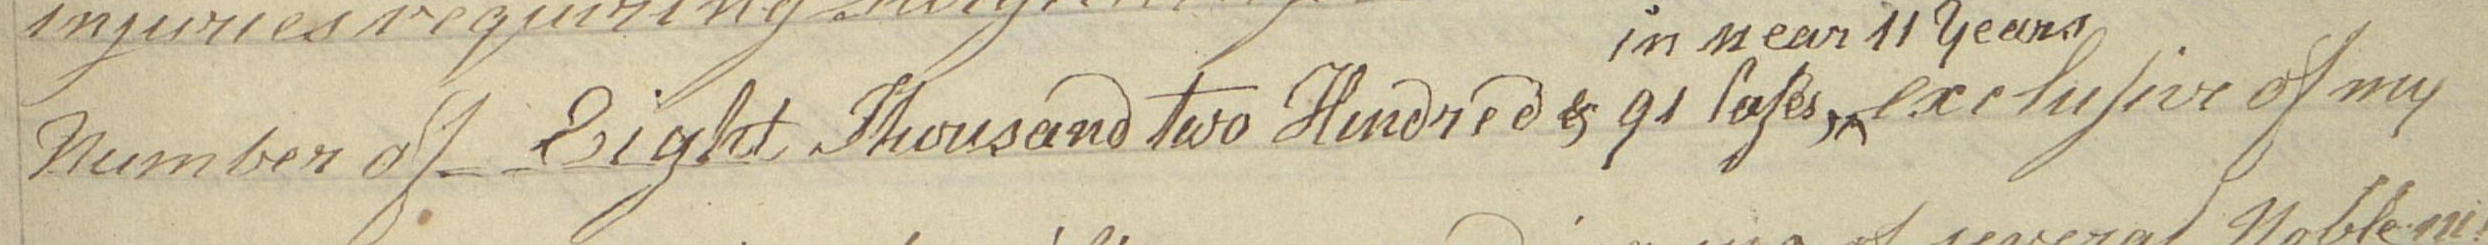Number of Eight Thousand two Hundred & 91 Cases, ^ exclusive of my
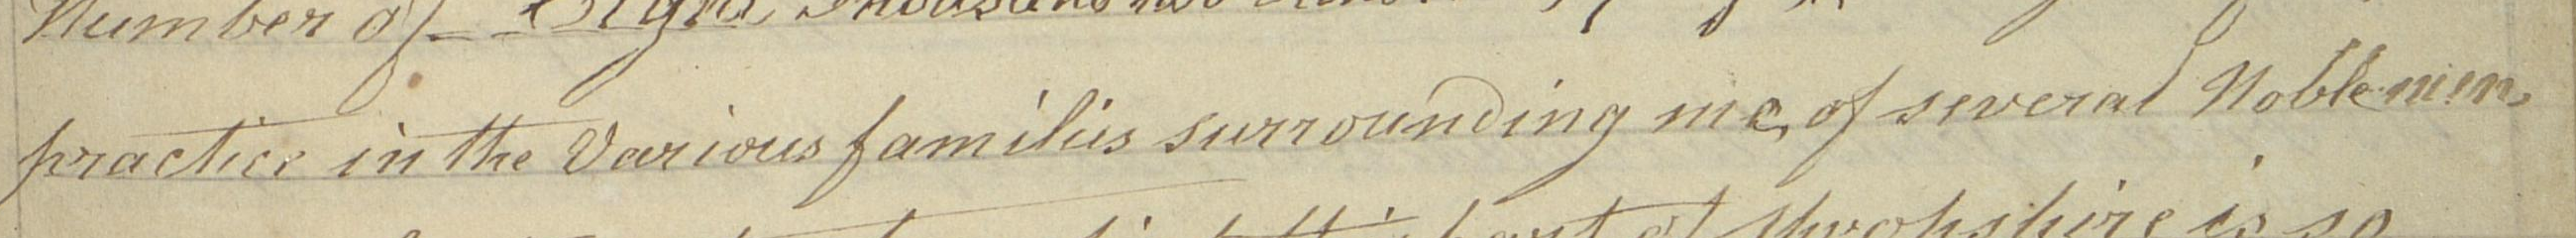practice in the Various families surrounding me, of several Noblemen
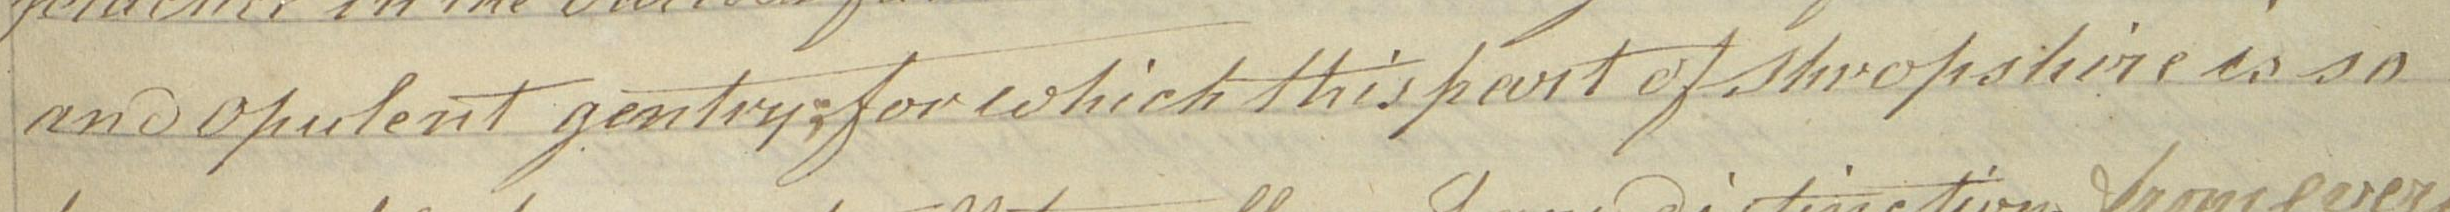and opulent gentry; for which this part of shropshire is so
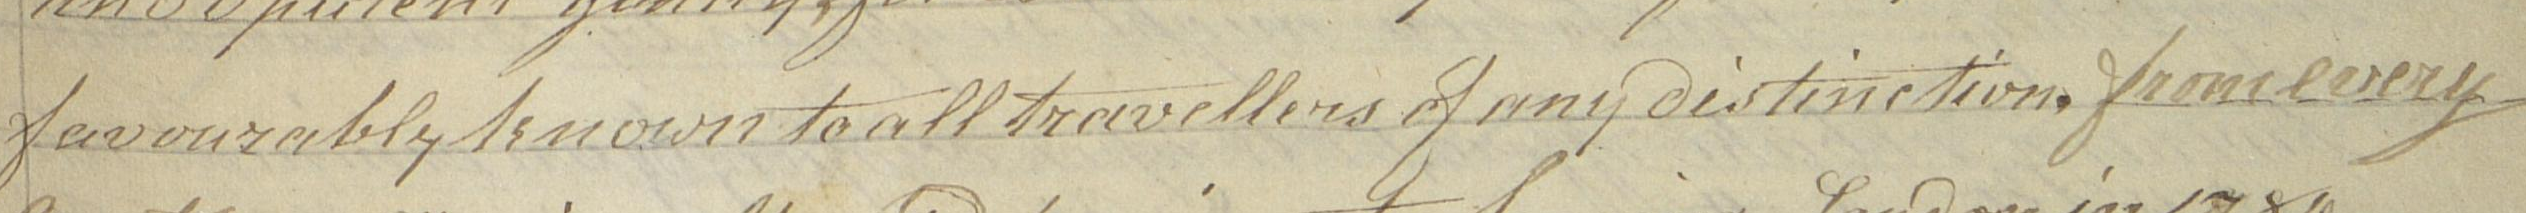favourably known to all travellers of my distinction, from every
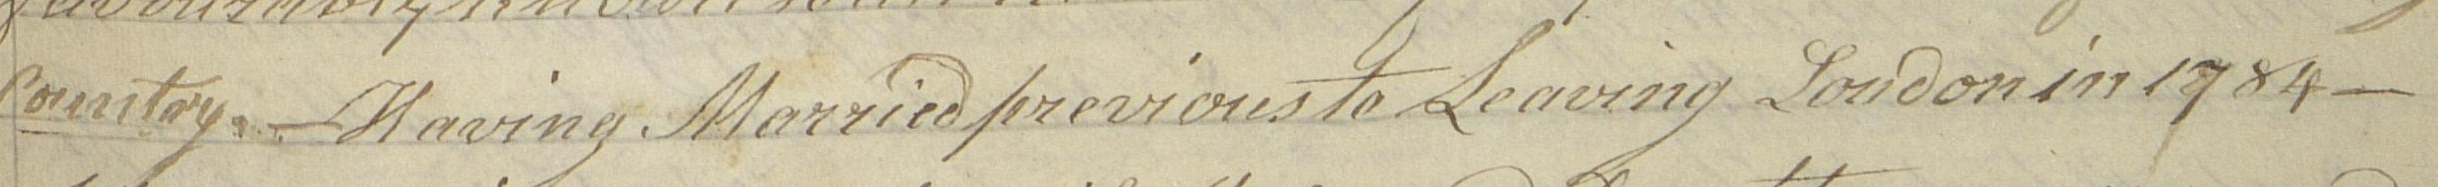Country. Having Married previous to Leaving London in 1784
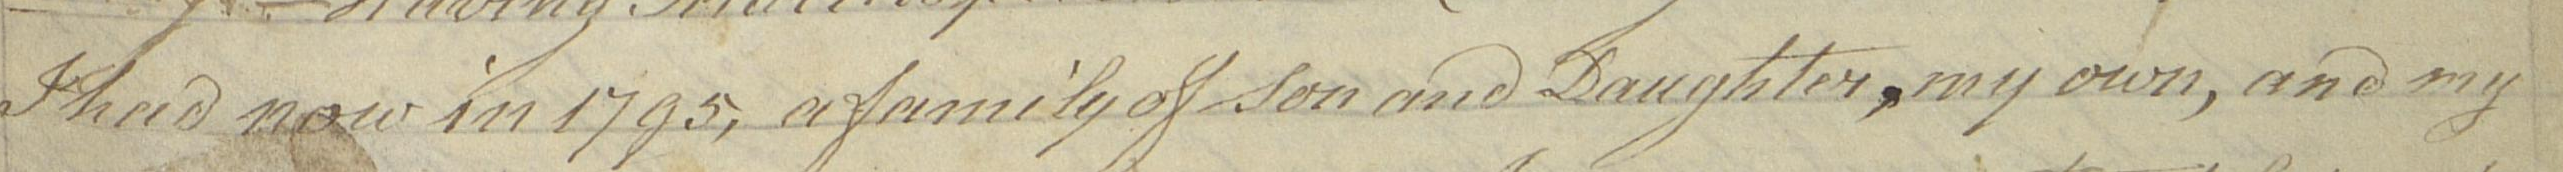had now in 1795, a family of son and Daughter, my own, and my
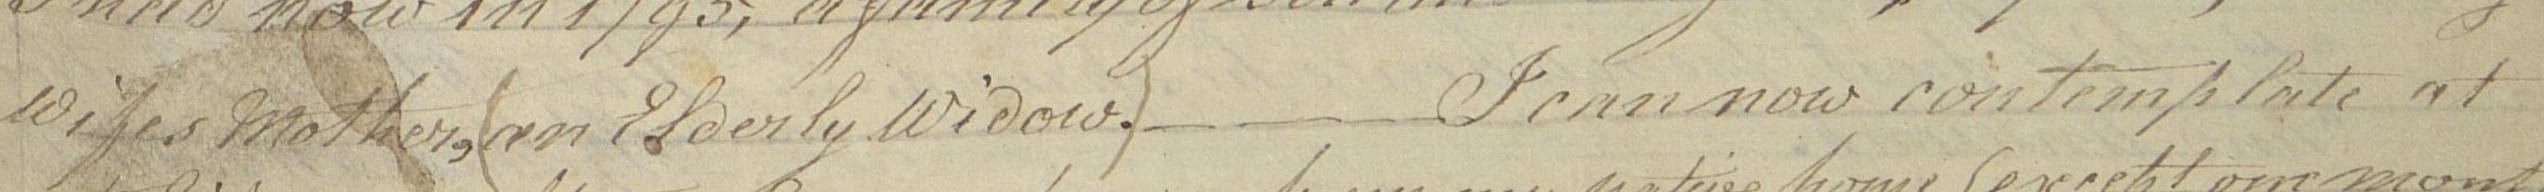Wifes Mother, (an Elderly Widow.) I can now contemplate at
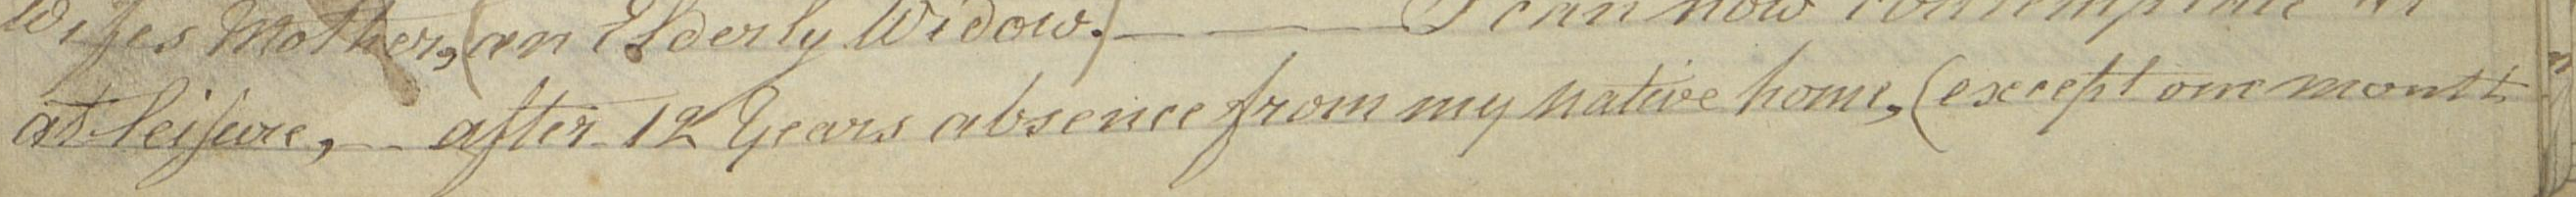at leisure, after 12 Years absence from my native home (except one month
